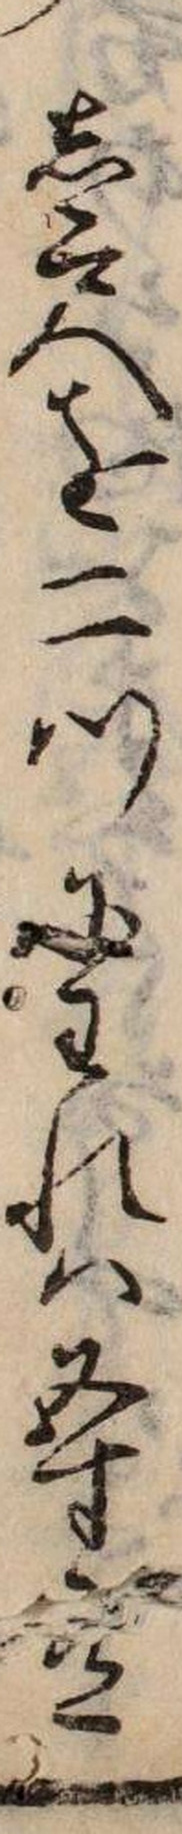壱尺二つにわれは五寸有
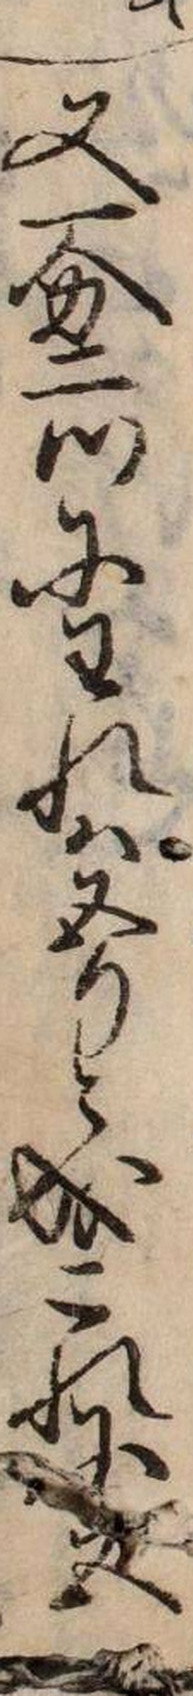又一分二つにわれは五りと成これに五
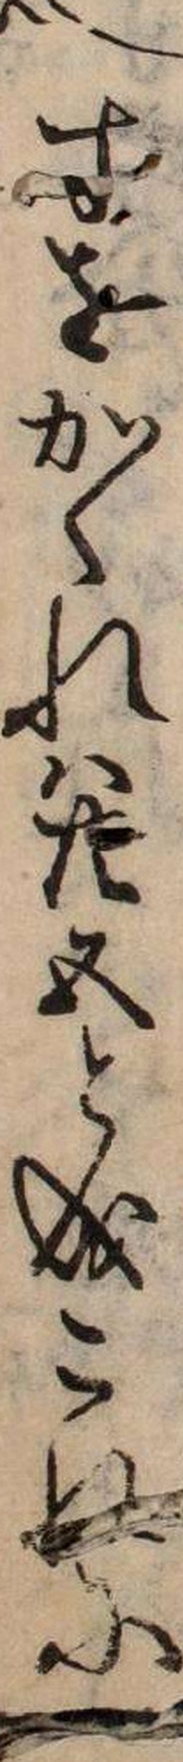寸をかくれは廿五と成これに

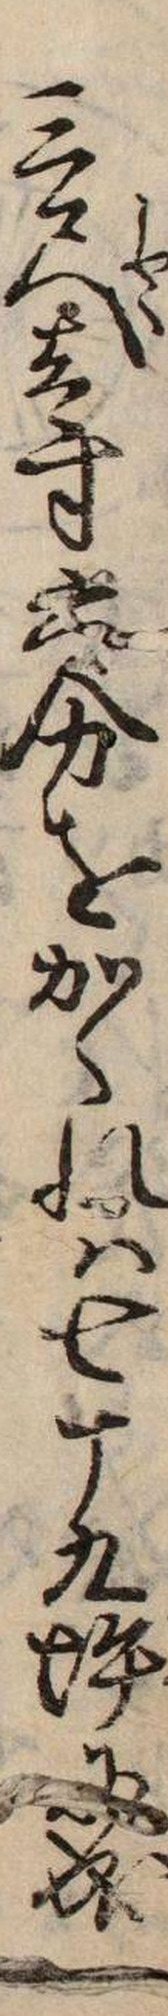三尺壱寸六分をかくれは七十九坪に成
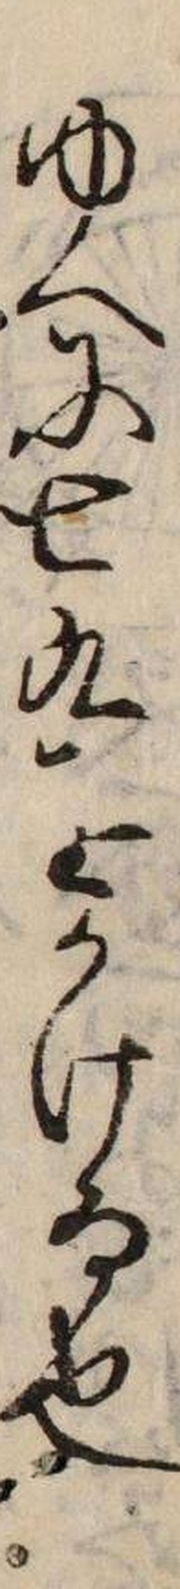ゆへに七九をかける也
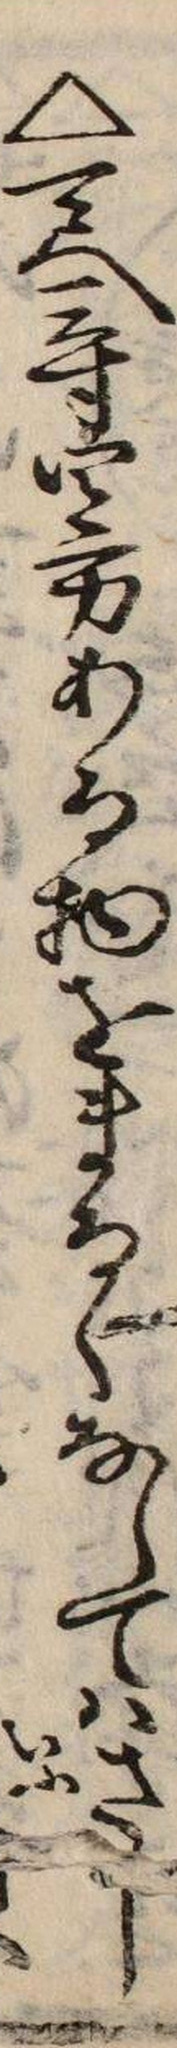△一尺三寸四方ある物をまるくなしてハさし
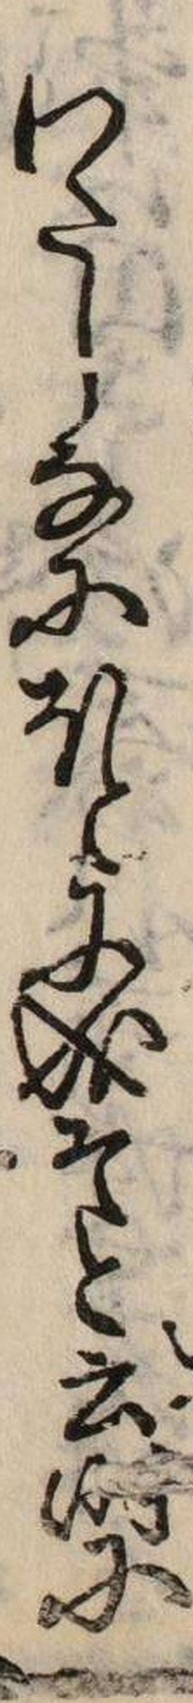わたしなにほとに成そと云時に
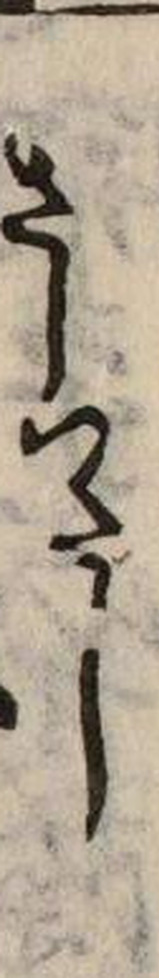さしわたし
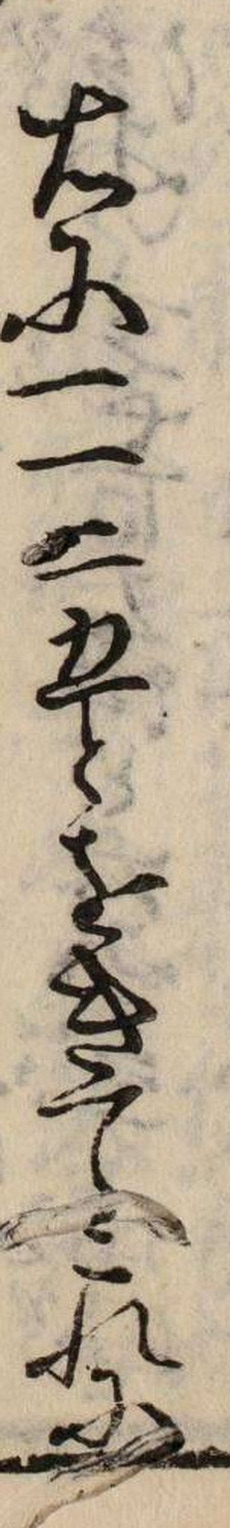右に一一二五とをきてこれに
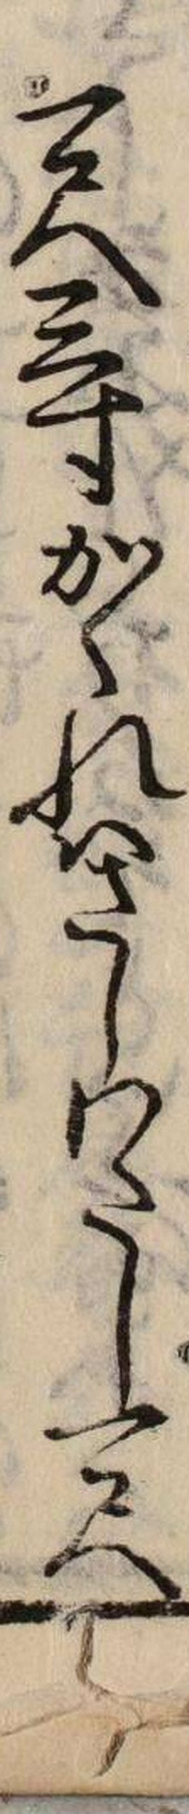一尺三寸かくれはさしわたし一尺
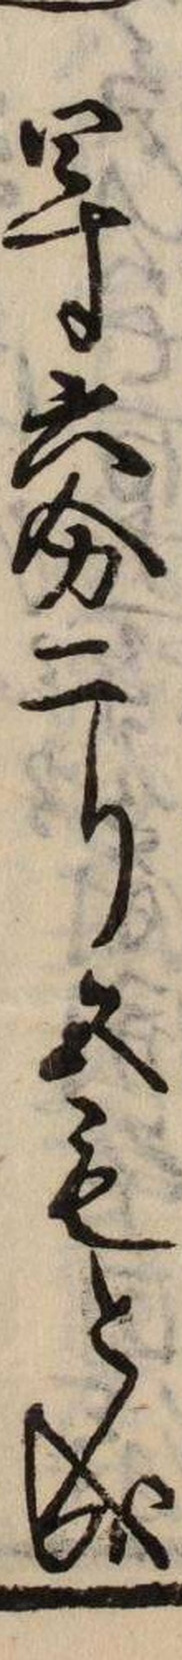四寸六分二り五毛と成
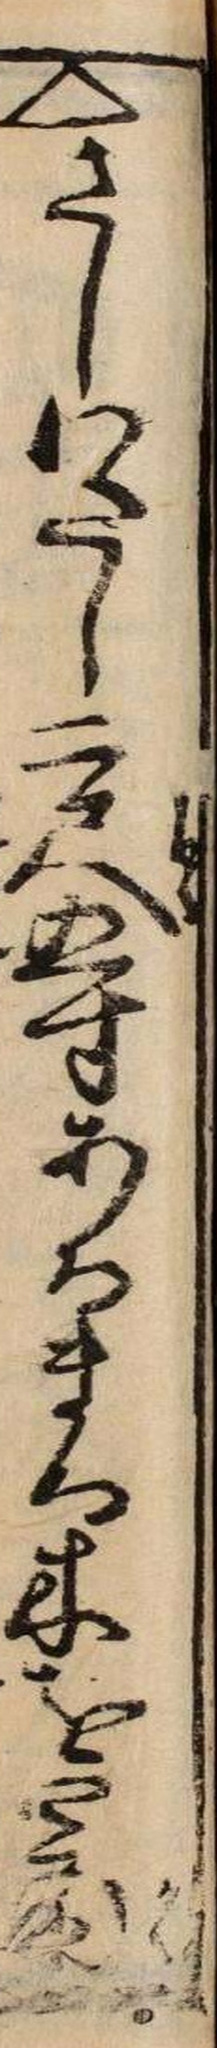△さしわたし二尺五寸あるまる木を四角
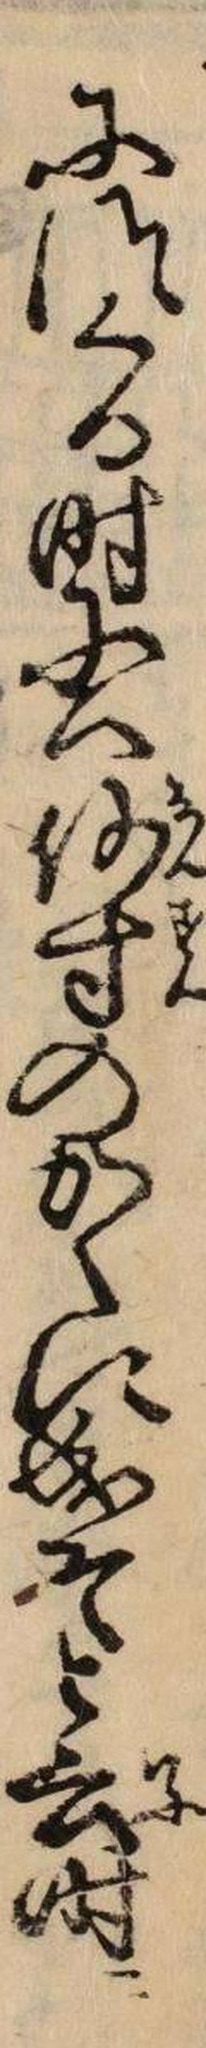につくる時には何寸のかくに成そと云時に
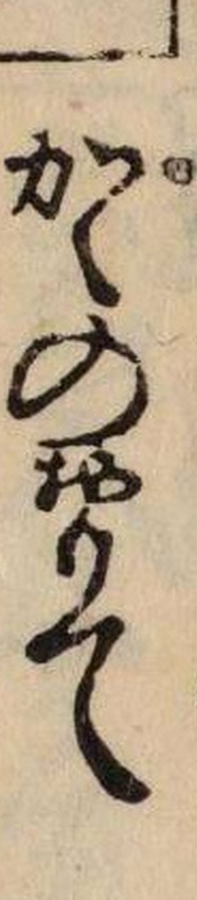かくのおりて
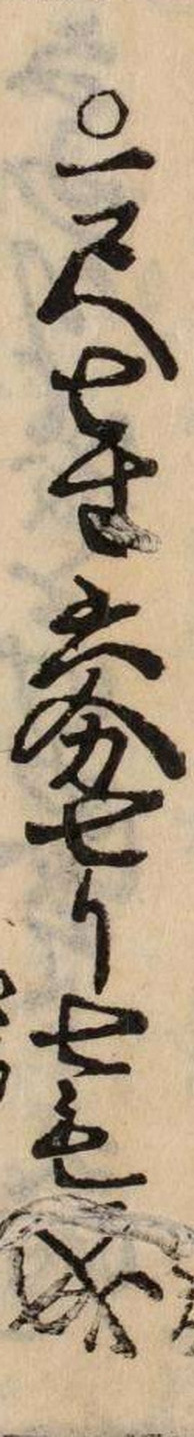○一尺七寸六分七り七毛に成
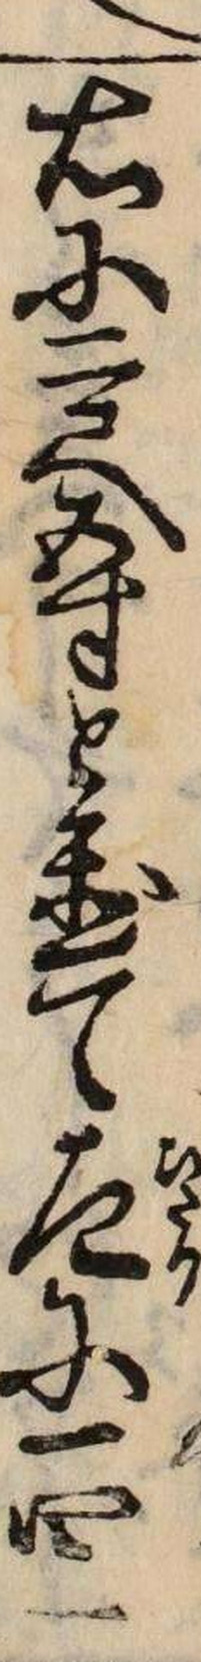右に二尺五寸と置て左に一四一
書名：塵劫記（寛永11年自跋、京都府立京都学・歴彩館追貴8）
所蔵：京都府立京都学・歴彩館 国文学研究資料館
